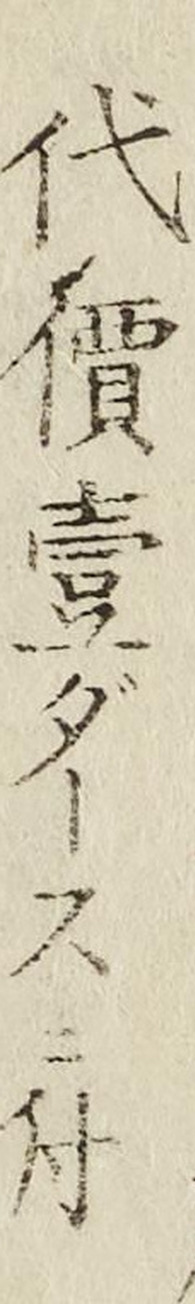代価壹ダースニ付
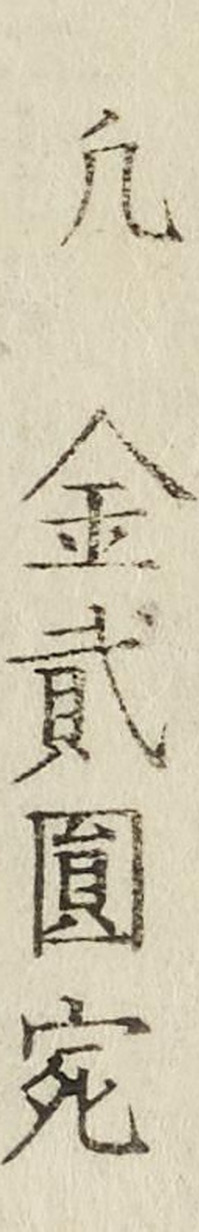凡金貳円宛
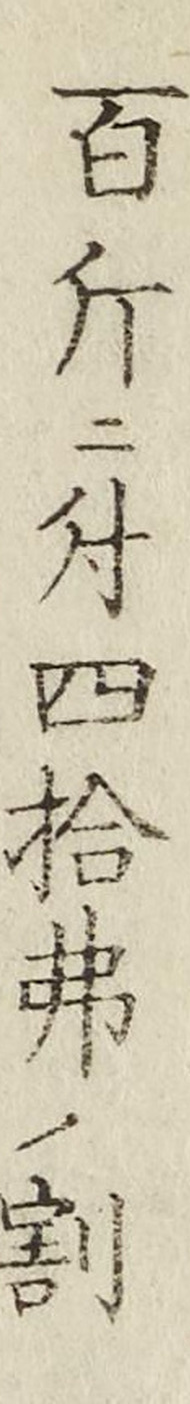百斤ニ付四拾弗ノ割
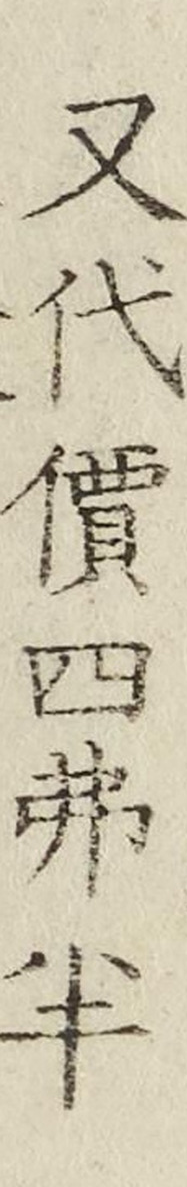又代価四弗半
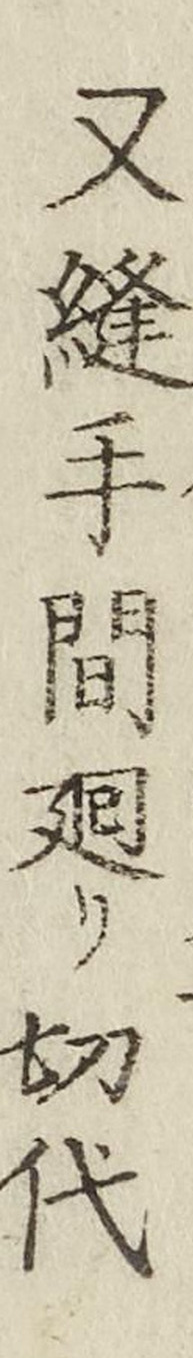又縫手間廻り切代
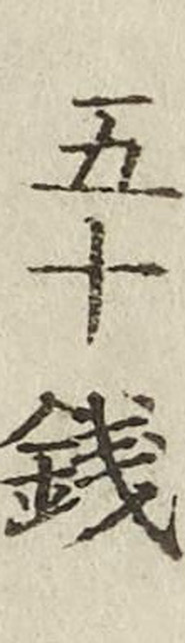五十銭
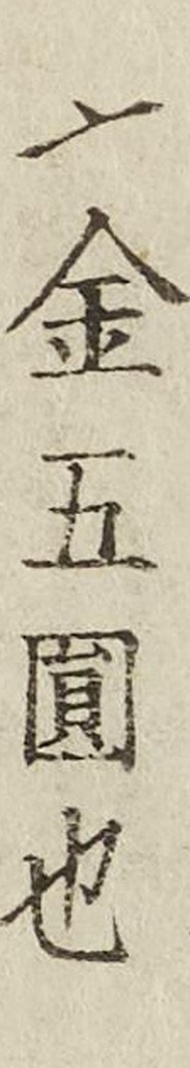〆金五円也
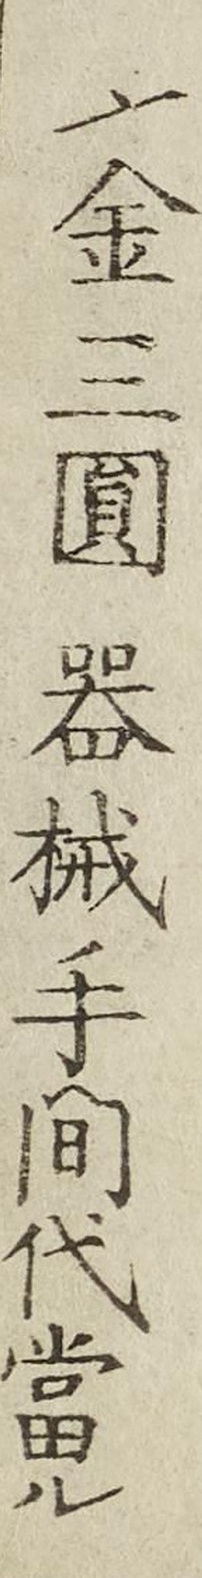〆金三円器械手間代当ル

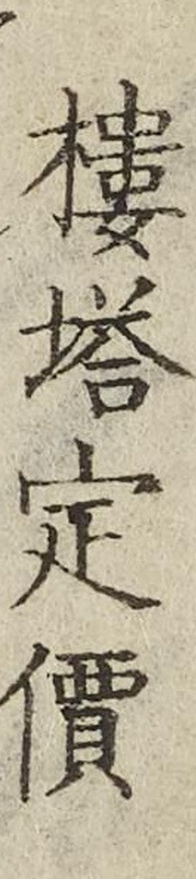楼塔定価
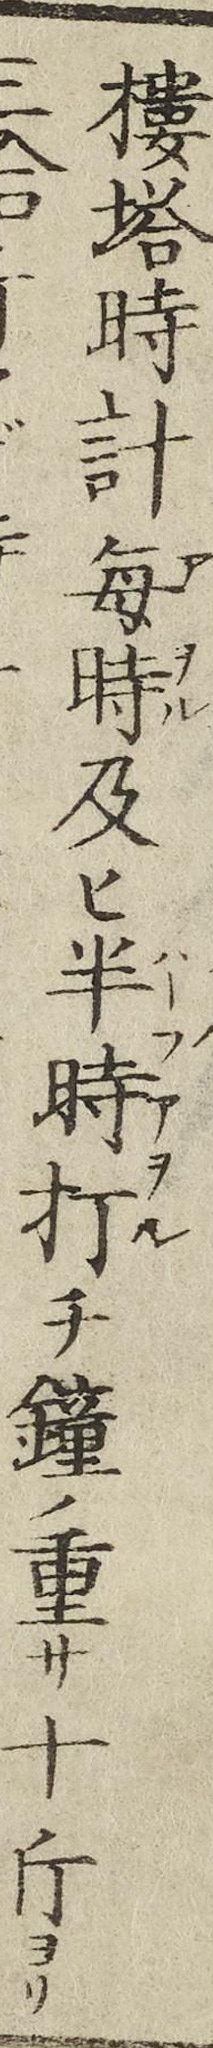楼塔時計毎時及ヒ半時打チ鐘ノ重サ十斤ヨリ
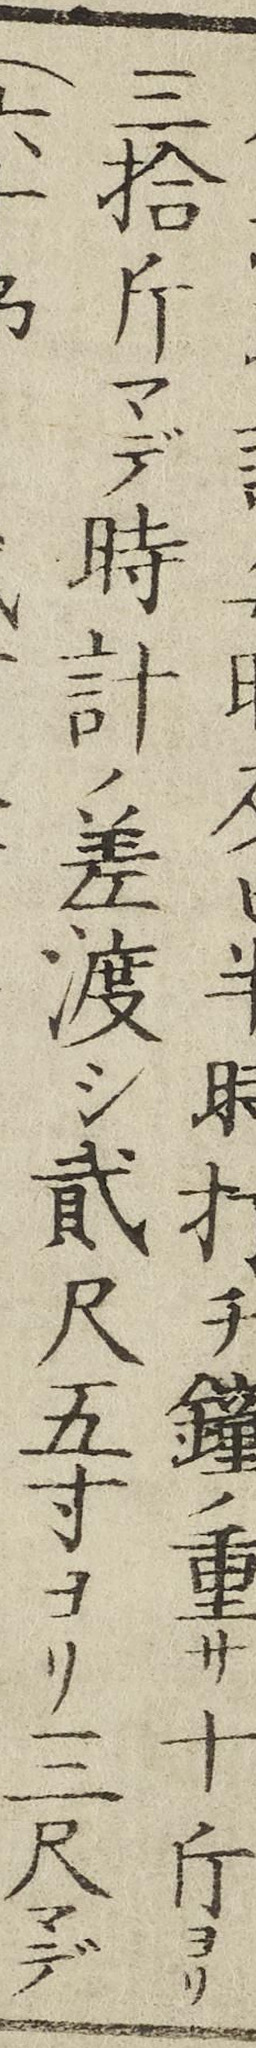三拾斤マデ時計ノ差渡シ貳尺五寸ヨリ三尺マデ
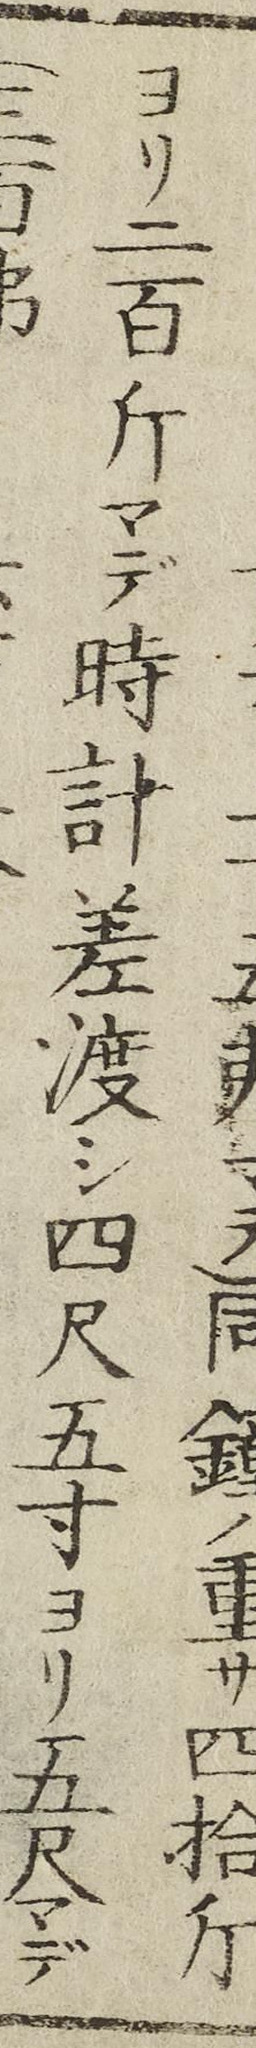ヨリ二百斤マデ時計差渡シ四尺五寸ヨリ五尺マデ
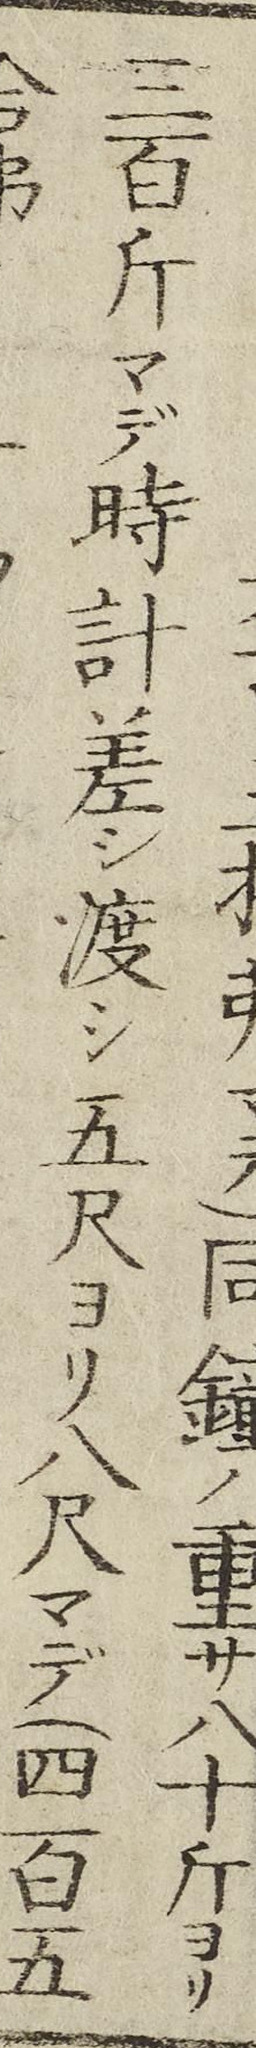三百斤マデ時計差シ渡シ五尺ヨリ八尺マデ（四百五
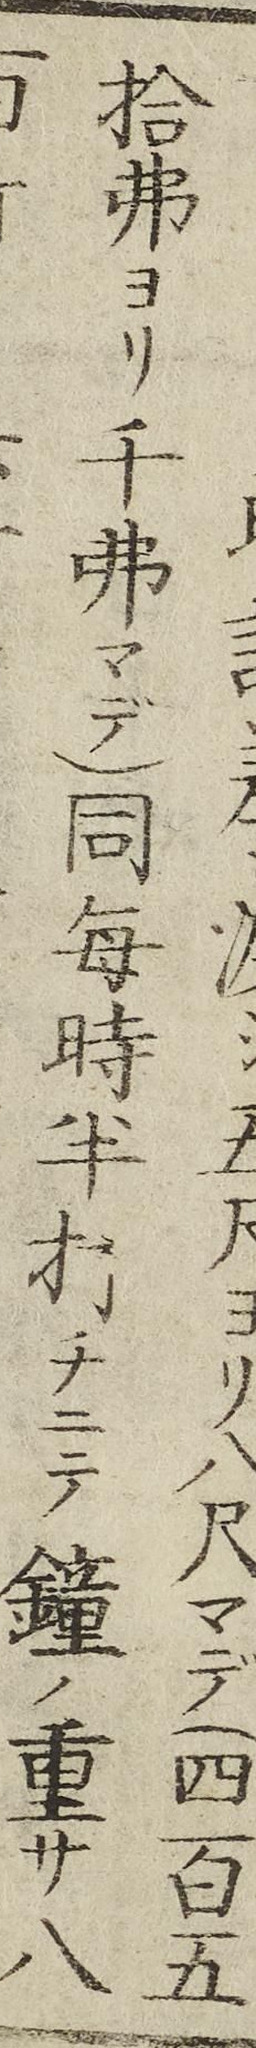拾弗ヨリ千弗マデ）同毎時半打チニテ鐘ノ重サ八
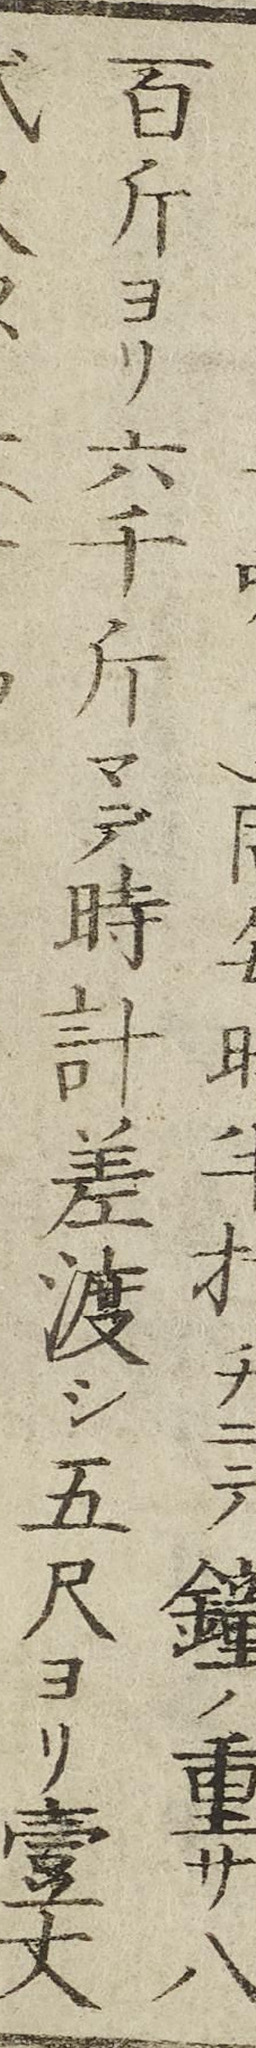百斤ヨリ六千斤マデ時計差渡シ五尺ヨリ壹丈

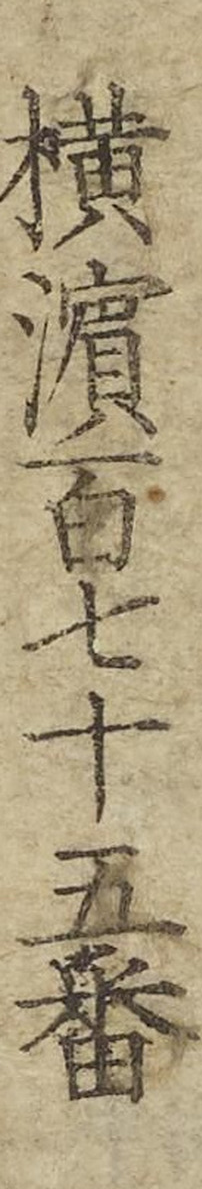横浜百七十五番
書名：[時計に関する冊子]
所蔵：東京大学地震研究所図書室 Earthquake Research Institute Library, The University of Tokyo, JAPAN
